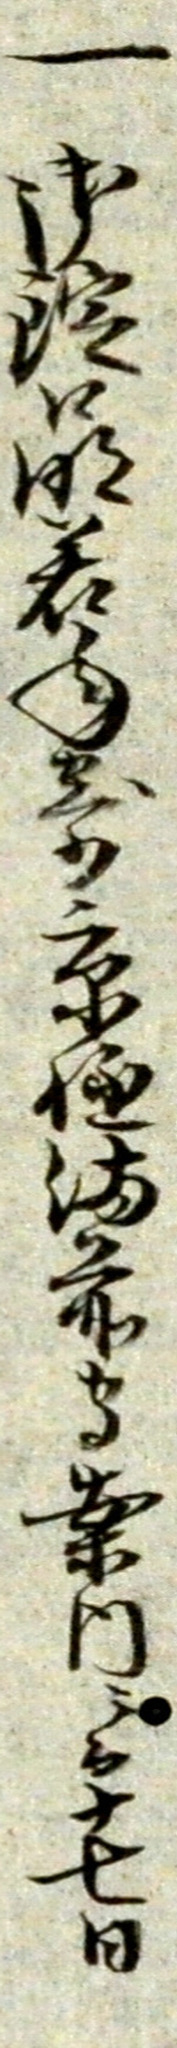一御錠口明若年寄京極備前守案内ニ而十七日
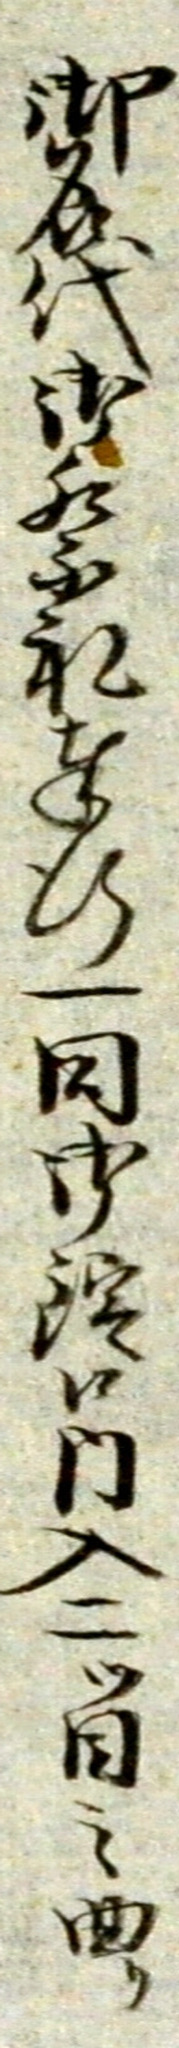御名代御祭礼奉行一同御錠口内入二ツ目之曲り
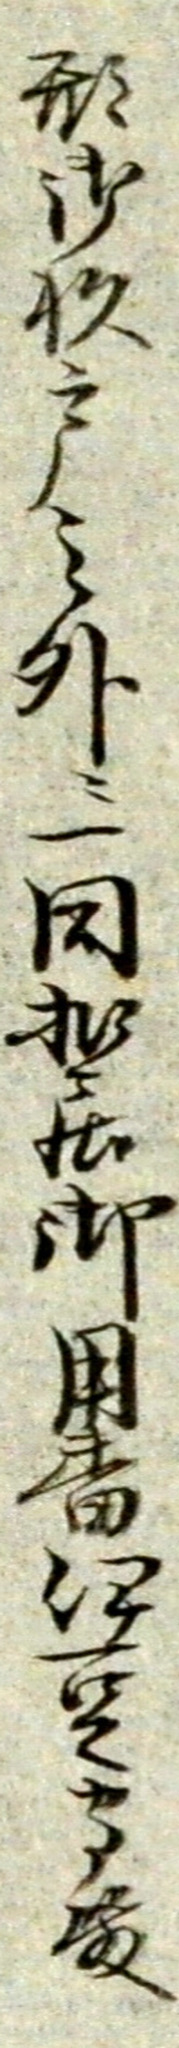形御杉戸之外ニ一同扣居御用番伊豆守殿
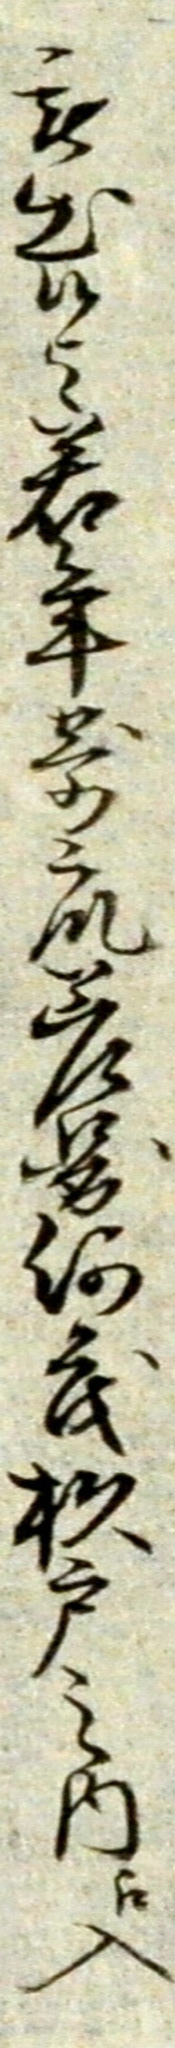被出候と若年寄衆差図何も杉戸之内江入
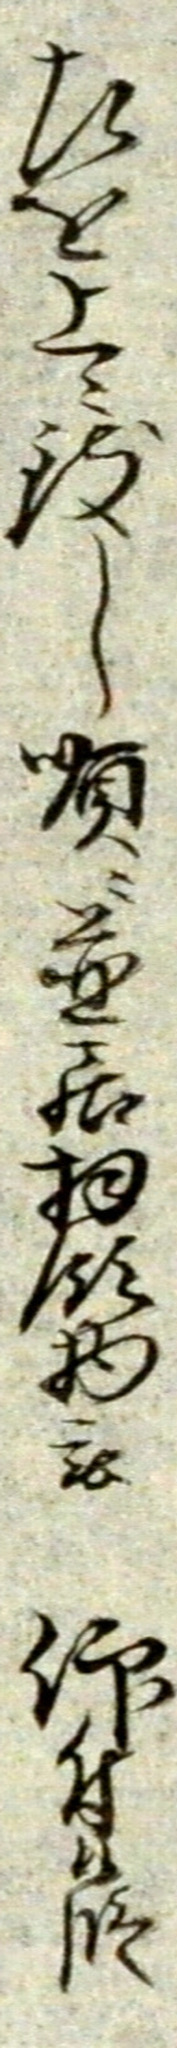左を上ニ致し順ニ並居拝領物被仰付候段
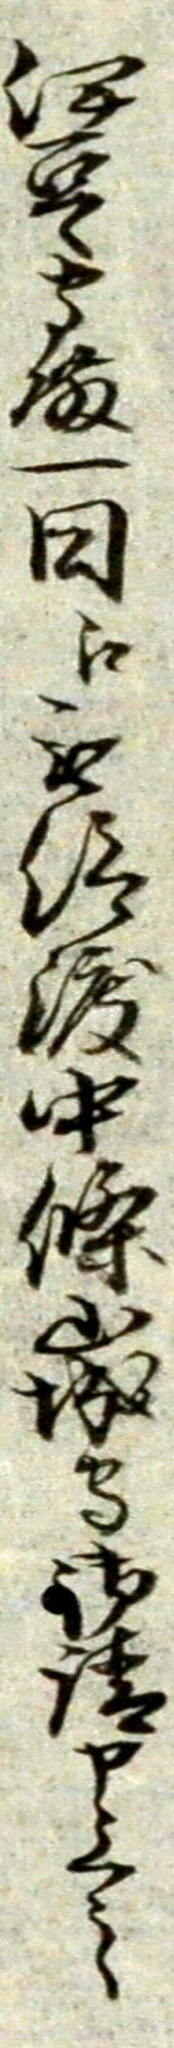伊豆守殿一同江被仰渡中條山城守御請申上之
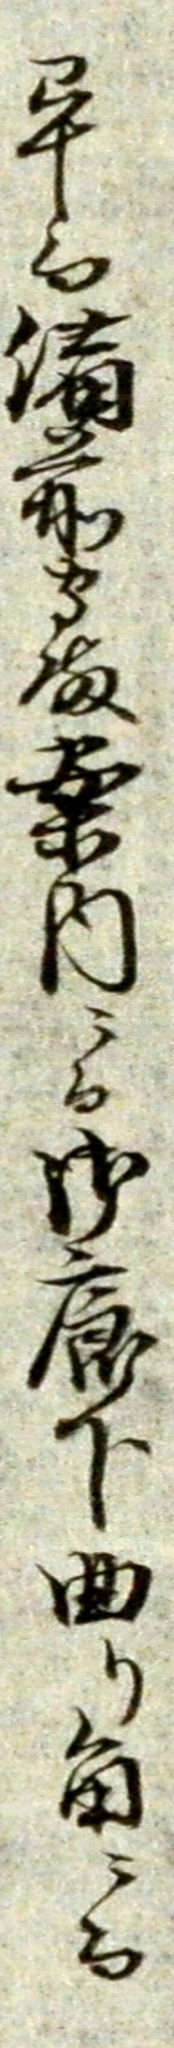畢而備前守殿案内ニ而御廊下曲り角ニ而
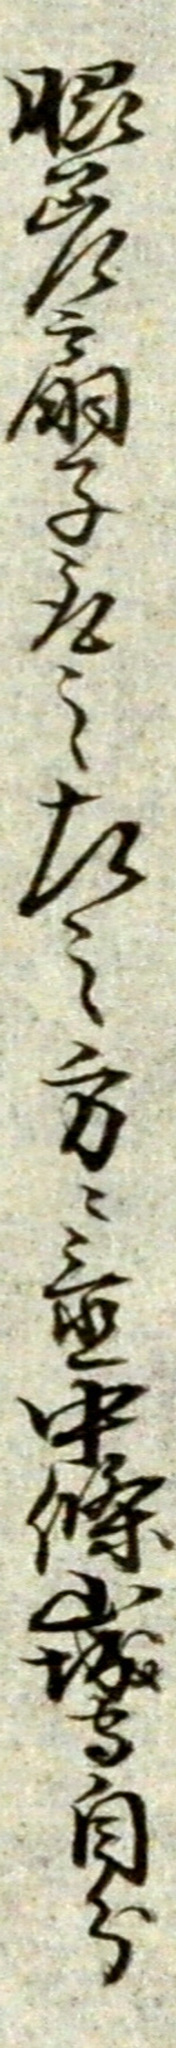脇差扇子取之左之方ニ置中條山城守自分
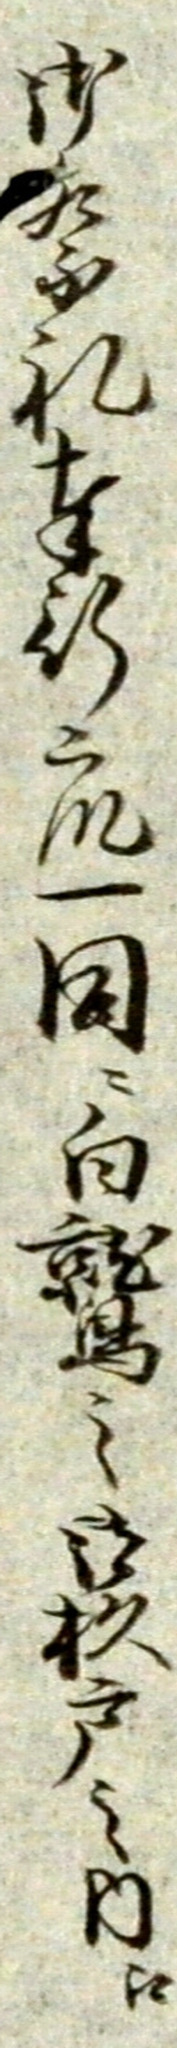御祭礼奉行衆一同ニ白鷲之御杉戸之内江
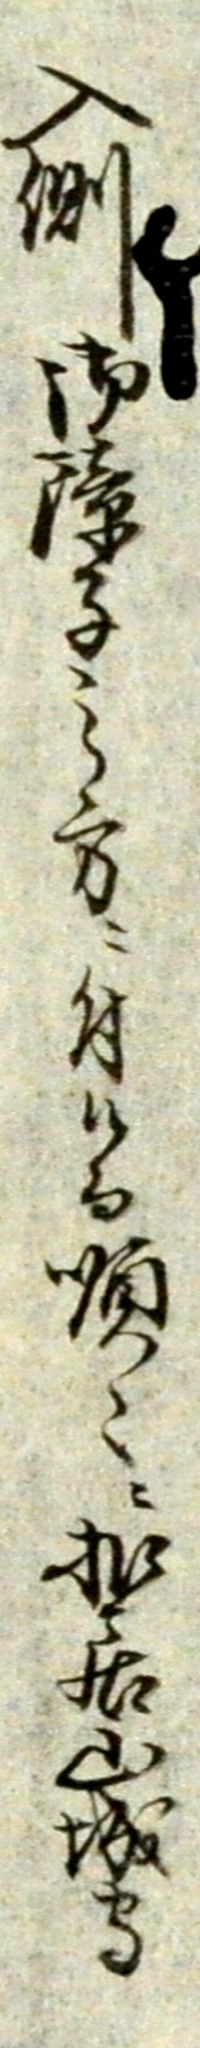入側御障子之方ニ付候而順々ニ扣居山城守
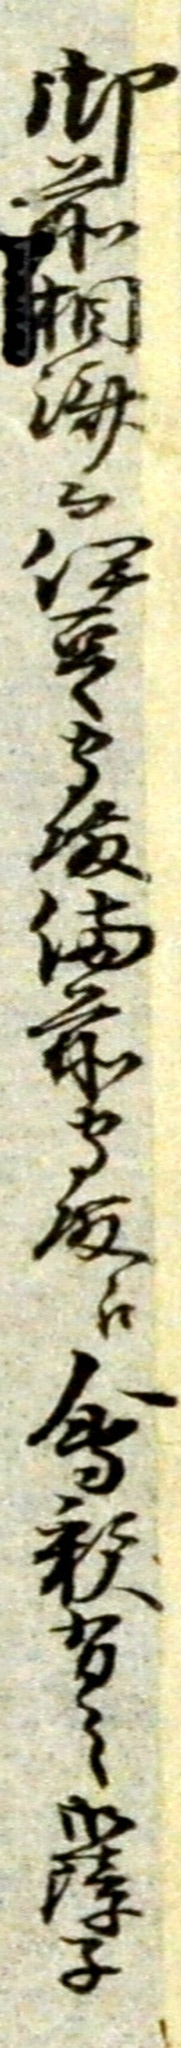御前相済而伊豆守殿備前守殿江会釈有之御障子
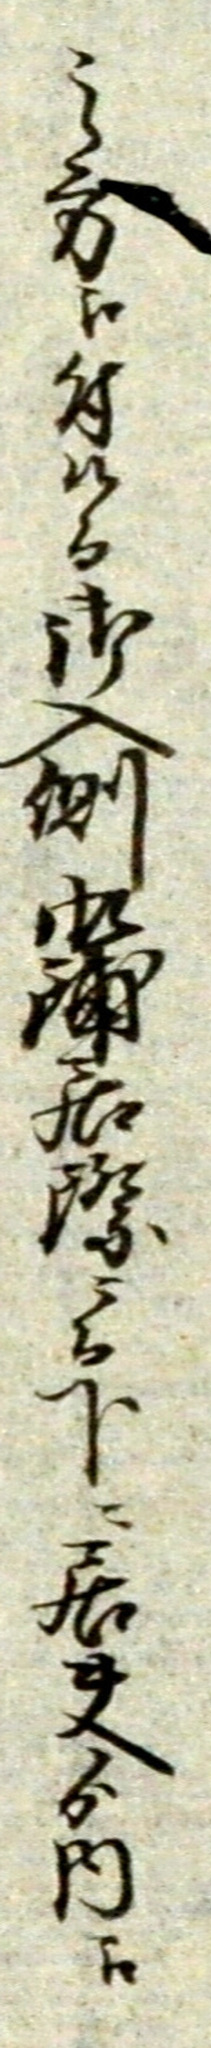之方江付候而御入側御鋪居際ニ而下ニ居夫ゟ内江
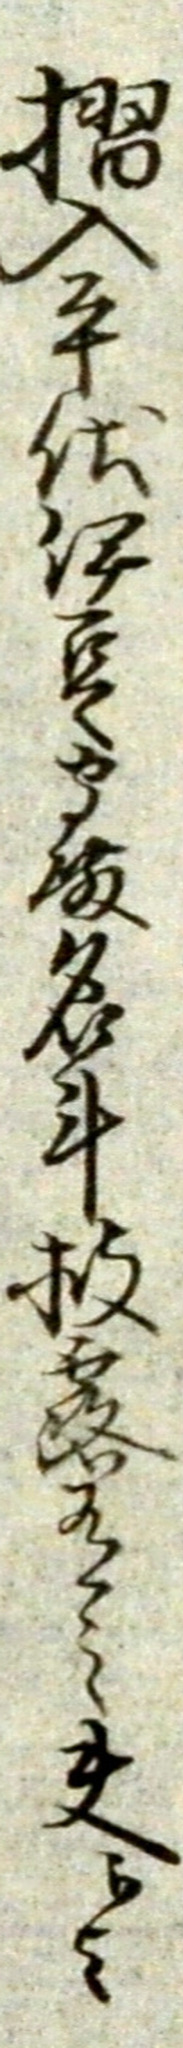摺入平伏伊豆守殿名計披露有之夫江と
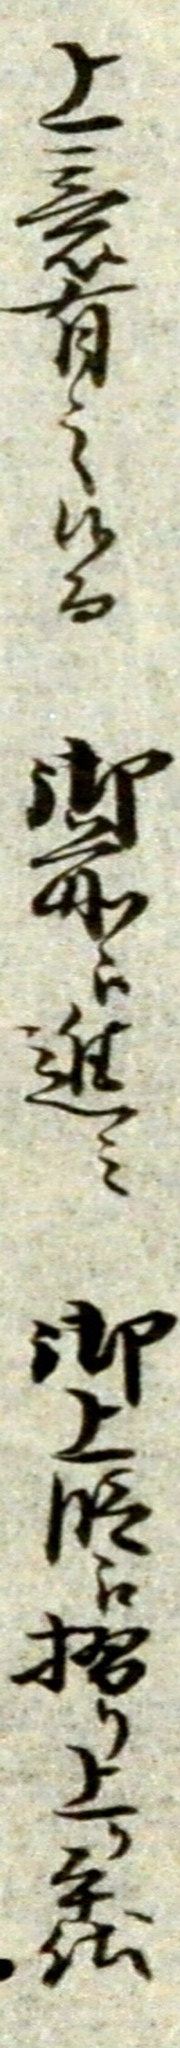上意有之候而御所江進ミ御上段江摺り上り平伏
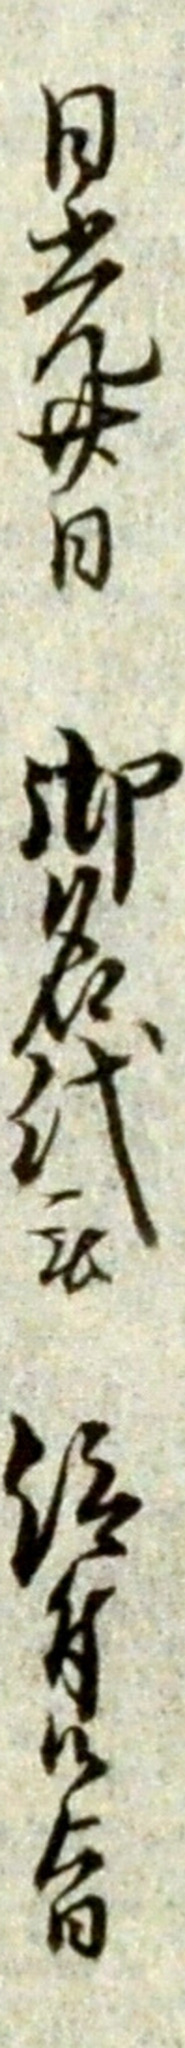日光廿日御名代被仰付候旨

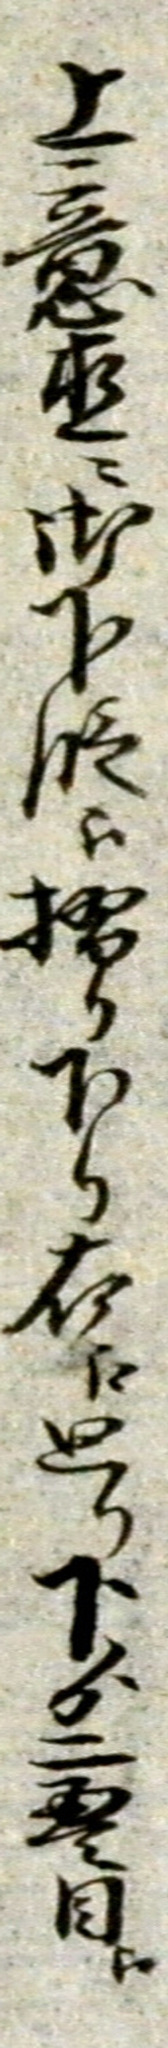上意直ニ御下段江摺り下り右江廻り下ゟ二畳目江
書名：日光御名代相勤候節ノ留
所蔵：伊那市立高遠町図書館・合同会社AMANE
